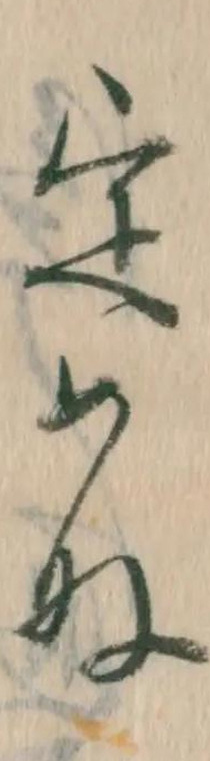定めぬ
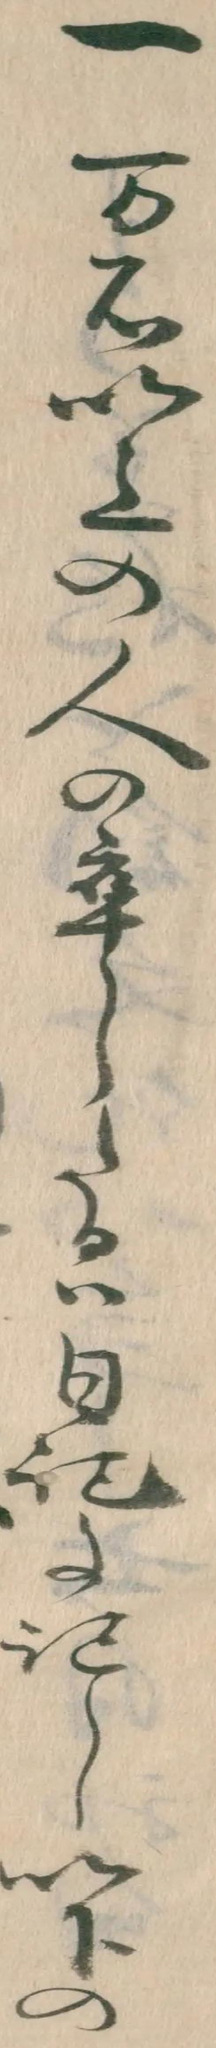一万石以上の人の卒したるは日記に記し以下の
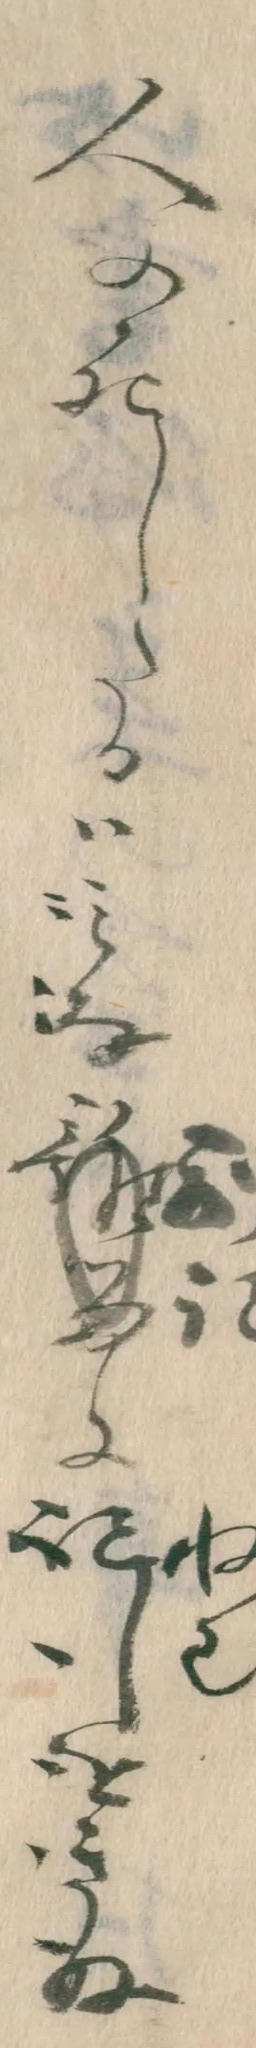人の死したるはみな別記に記しをきぬ収む
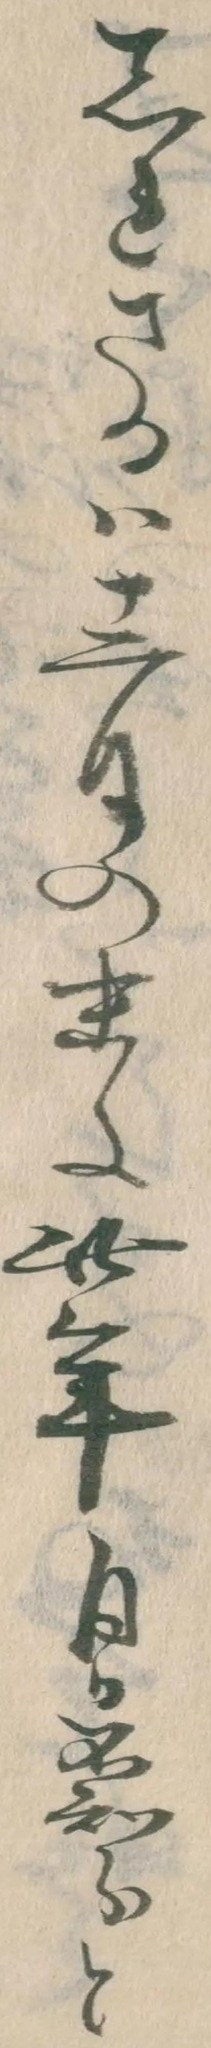しれさるは十二月の末に此年月日不知と

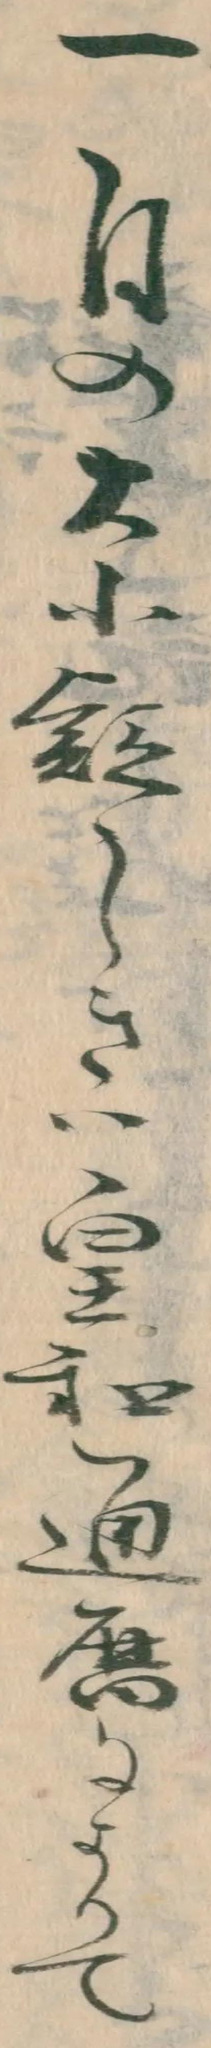一月の大小疑しきは皇和通暦によりて

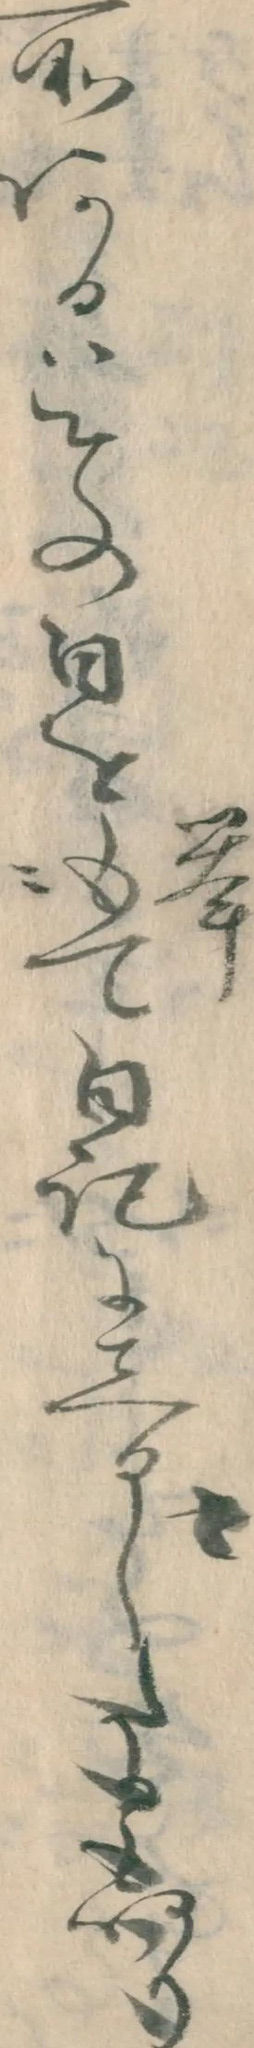所あるはその日をもて日記にしるしたるもあり
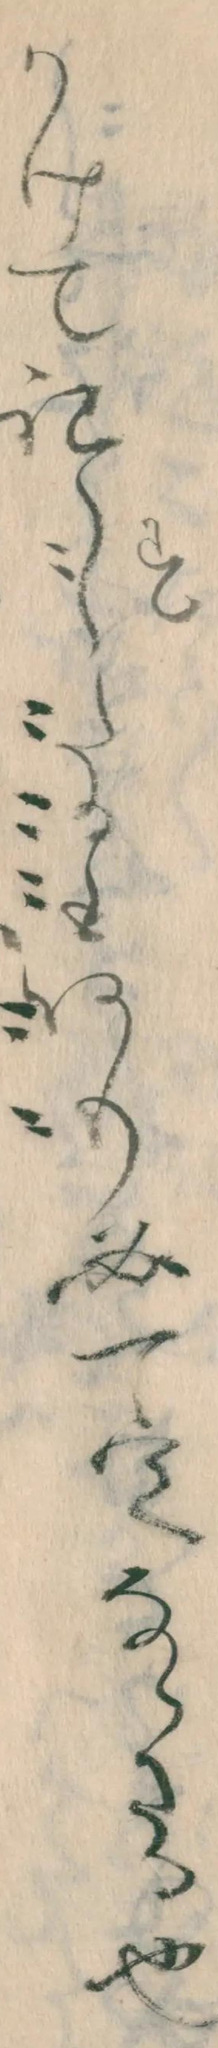かけて記したるもありぬす一定ならさる也
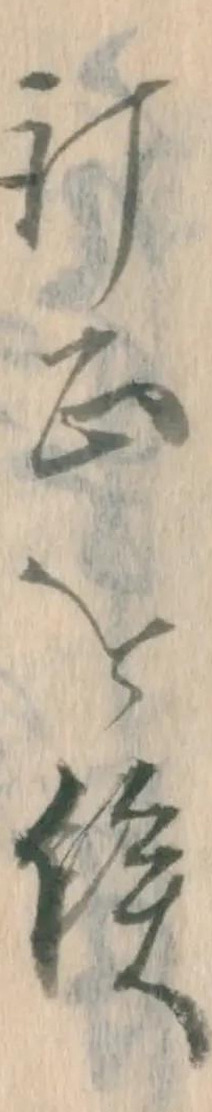訂正を俟
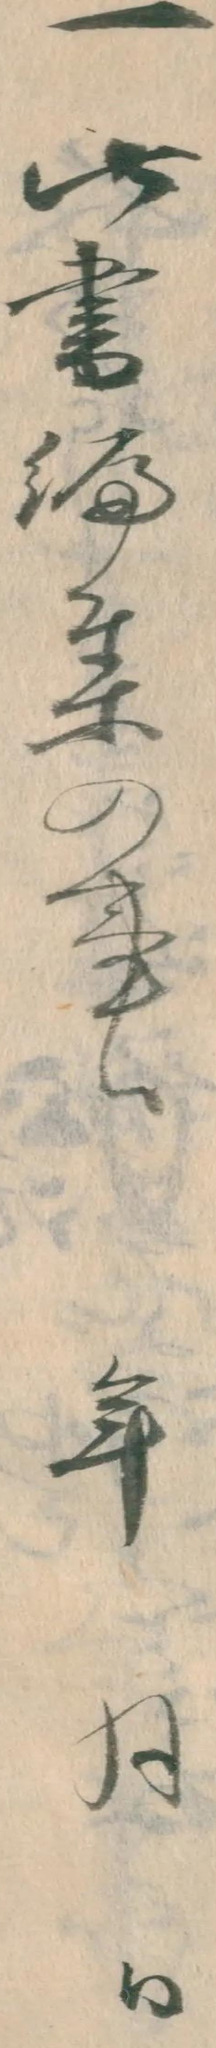一此書編集の事は年月日
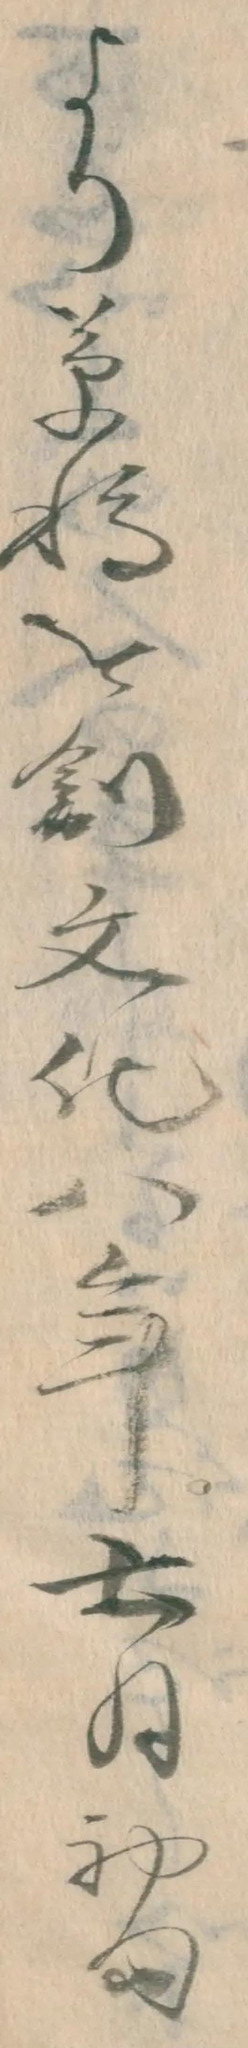より草稿を創文化八年七月初旬
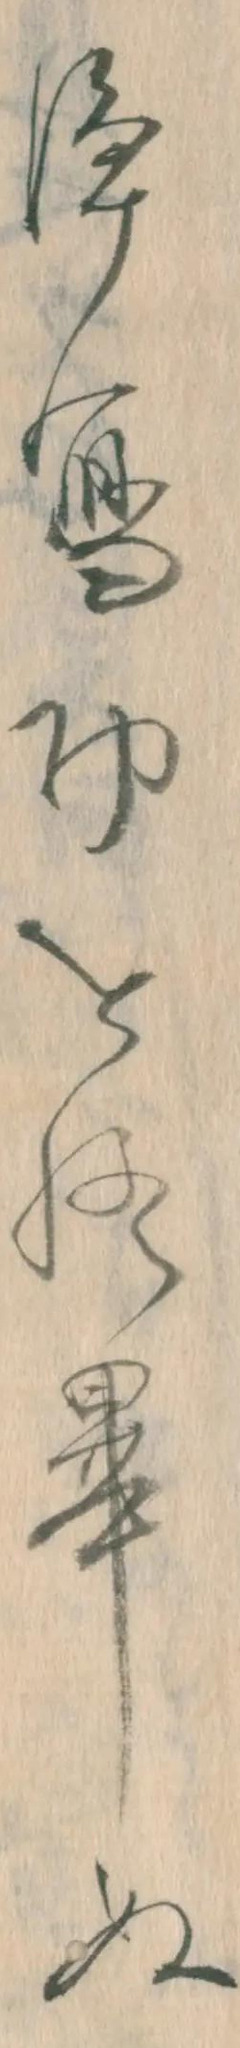浄写功を終畢ぬ
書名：輪池叢書. 12
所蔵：国立国会図書館 National Diet Library, JAPAN
